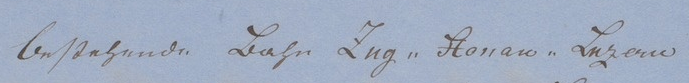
bestehende Bahn Zug–Honau –Luzern
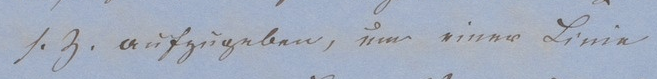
s. Z. aufzugeben, um einer Linie
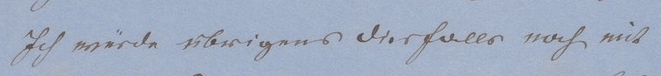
Ich würde übrigens diesfalls noch mit
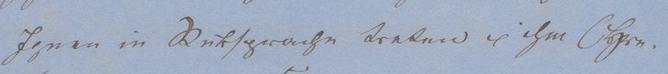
Ihnen in Rüksprache treten & ihm Hrn.
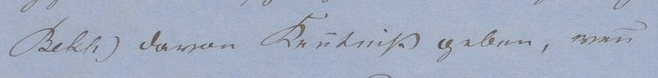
Bekh) davon Kenntniß geben, wenn
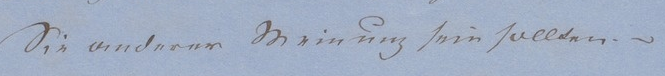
Sie anderer Meinung sein sollten. –
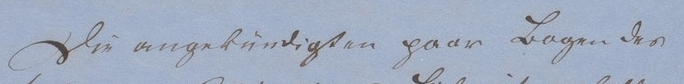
Die angekündigten paar Bogen des
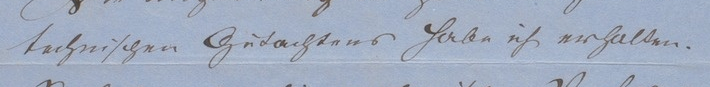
technischen Gutachtens habe ich erhalten.
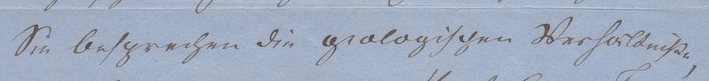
Sie besprechen die geologischen Verhältniße,
